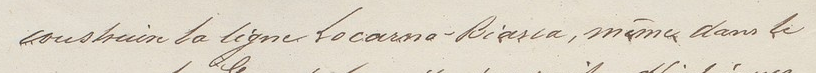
construire la ligne Locarno–Biasca, même dans le
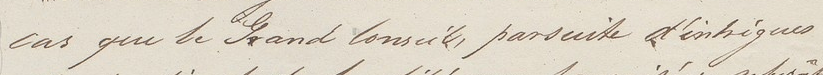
cas que le Grand Conseil, parsuite d'intrigues
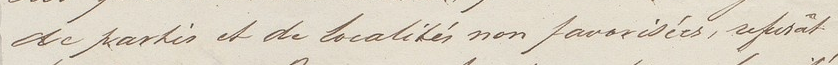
de partis et de localités non favorisées, refusât
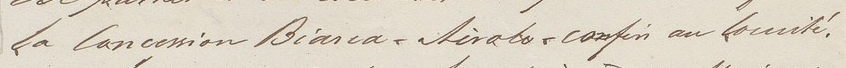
la Concession Biasca–Airolo – confiee au Comité.
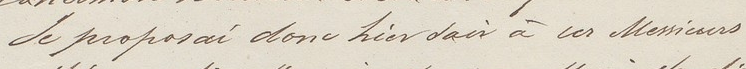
Je proposai donc hier soir à ces Messieurs
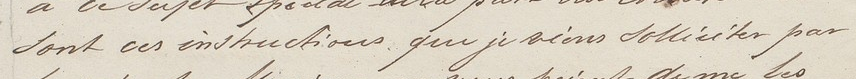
sont ces instructions que je viens solliciter par
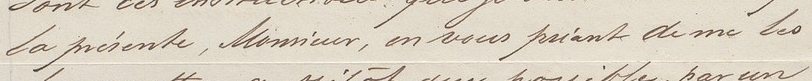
la présente, Monsieur, en vous priant de me les
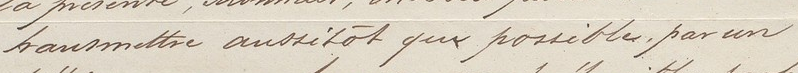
transmettre aussitôt que possible par un
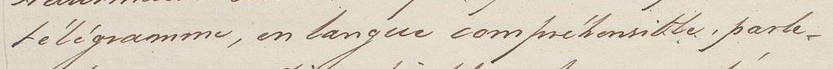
télégramme, en langue compréhensible, par le-
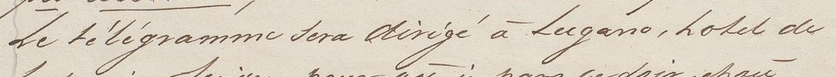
Le télégramme sera dirigé à Lugano, hotel de
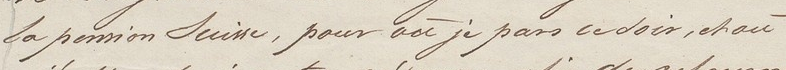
la pension Suisse, pour où je pars ce soir, et où
